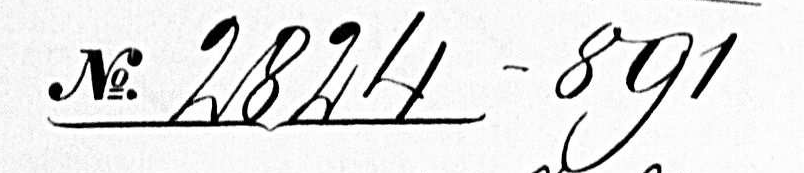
No. 2824 - 1891
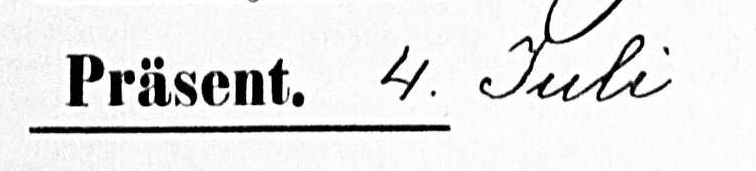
Präsent. 4. Juli
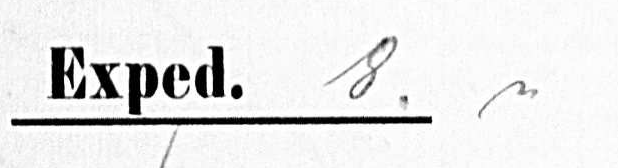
Exped. 8. Juli
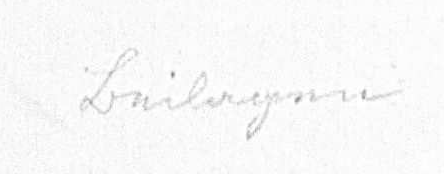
Beilagen
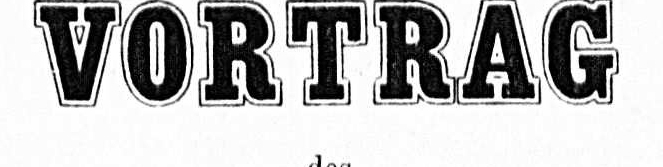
VORTRAG
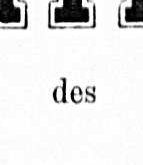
des
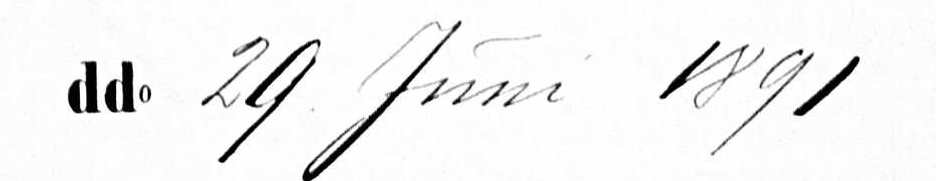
ddo 29. Juni 1891
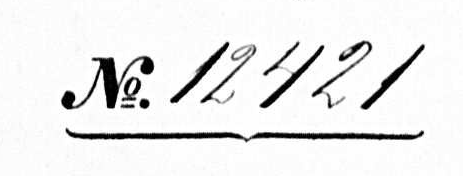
No. 12421
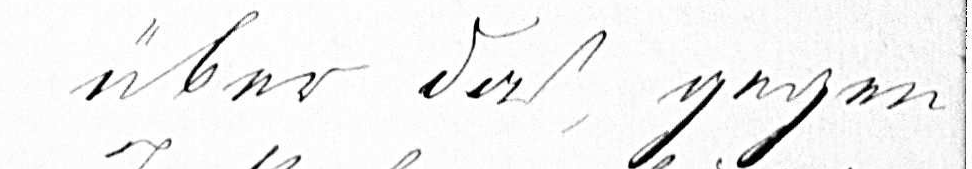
Über das gegen
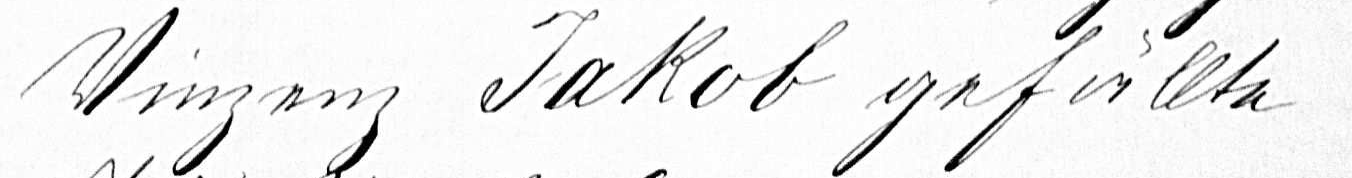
Vinzenz Jakob gefällte
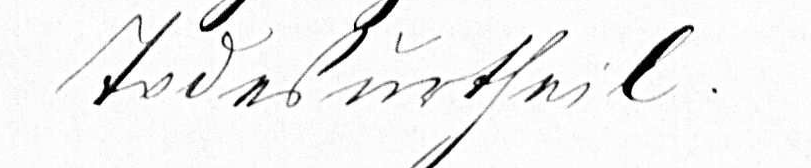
Todesurtheil.
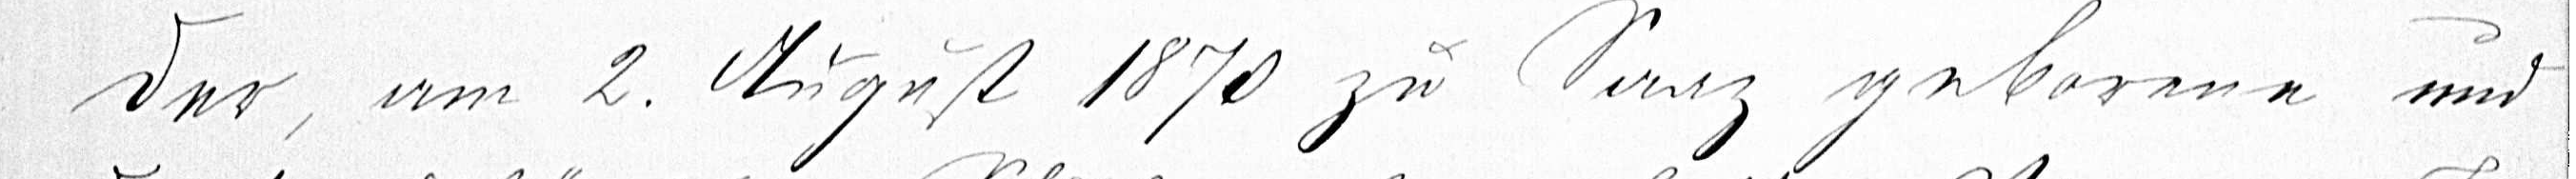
Der, am 2. August 1870 zu Saaz geborene und
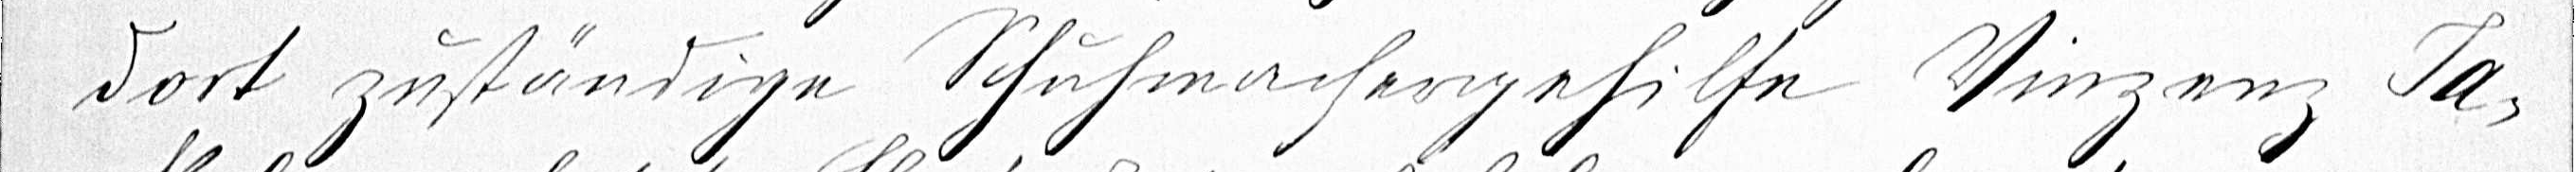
dort zuständige Schuhmachergehilfe Vinzenz Ja¬
